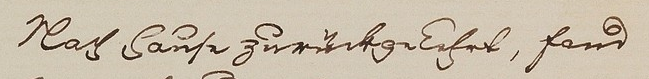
Nach Hause zurückgekehrt, fand
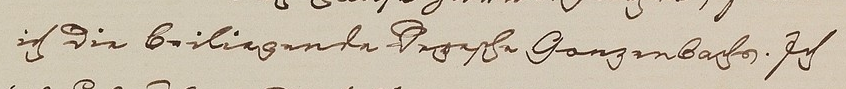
ich die beiliegende Depesche Gonzenbachs. Ich
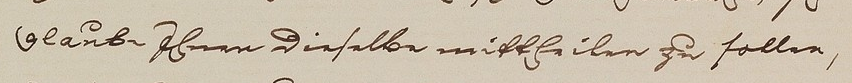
glaube Ihnen dieselbe mittheilen zu sollen,
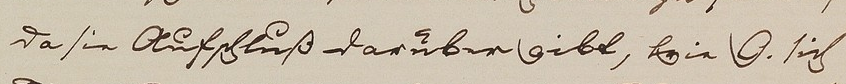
da sie Aufschluß darüber gibt, wie G. sich
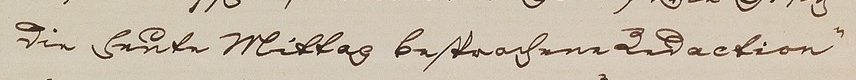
die heute Mittag besprochene «Redaction»
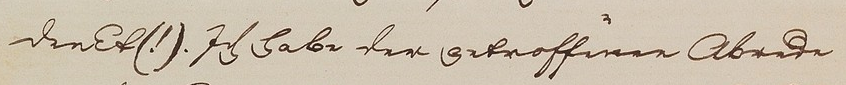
denkt (!). Ich habe der getroffenen Abrede
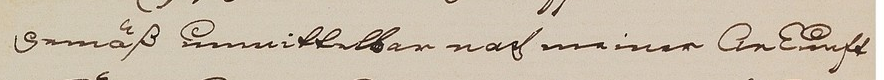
gemäß unmittelbar nach meiner Ankunft
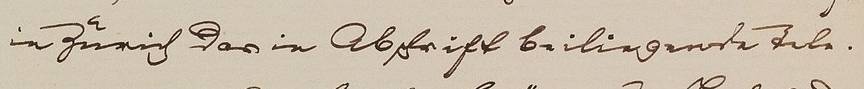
in Zürich das in Abschrift beiliegende Tele-
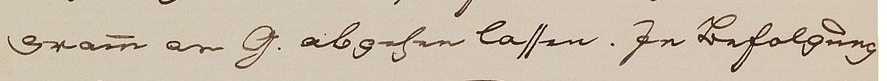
gramm an G. abgehen lassen. In Befolgung
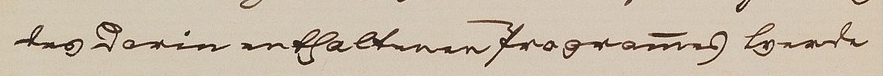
des darin enthaltenen Programmes werde
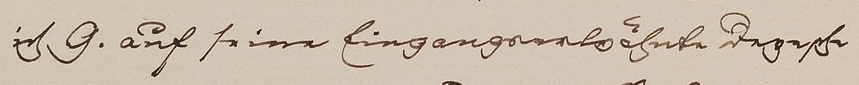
ich G. auf seine Eingangserwähnte Depesche
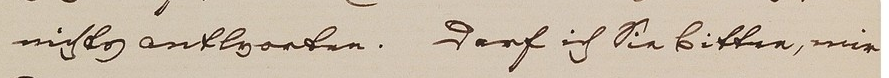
nichts antworten. Darf ich Sie bitten, mir
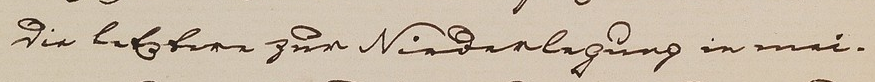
die letztere zur Niederlegung in mei-
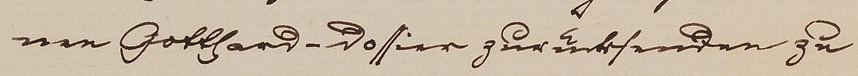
nen Gotthard-Dossier zurücksenden zu
